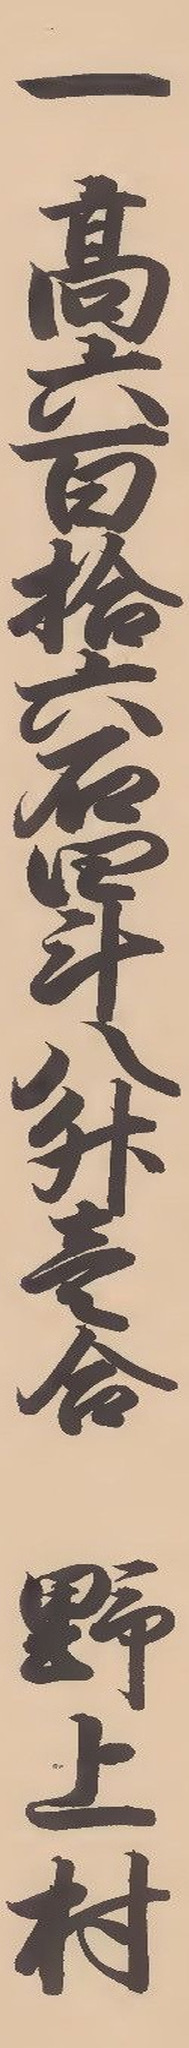一高六百拾六石四斗八升壱合野上村
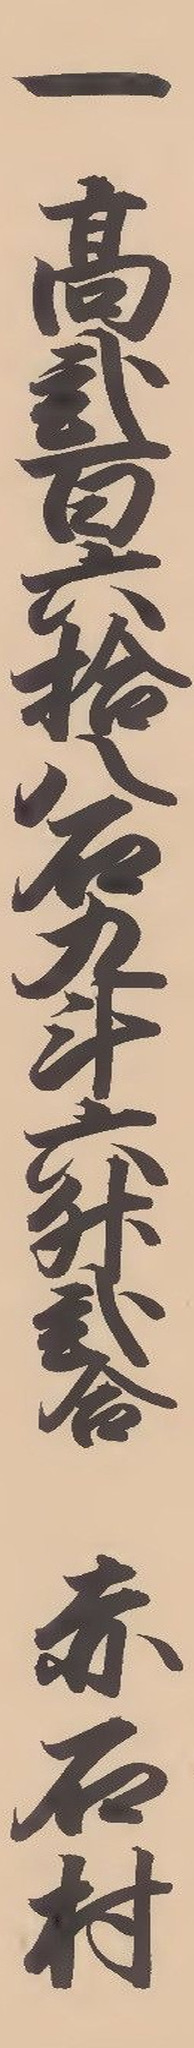一高弐百六拾八石九斗六升弐合赤石村
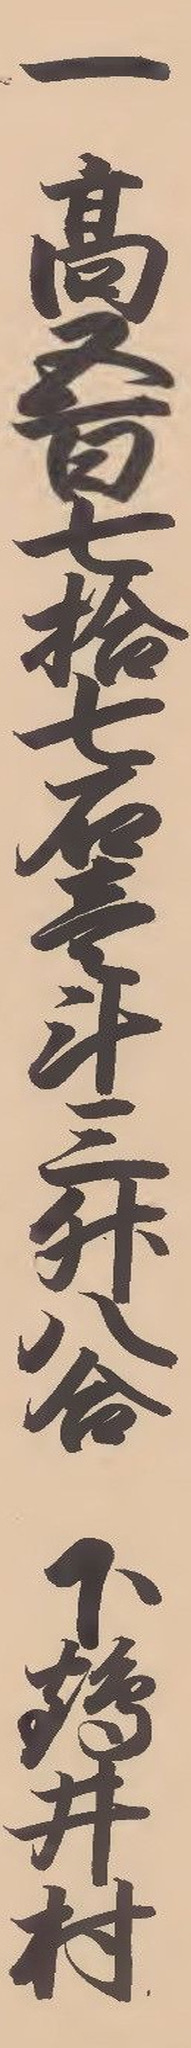一高五百七拾七石壱斗三升八合下鶴井村
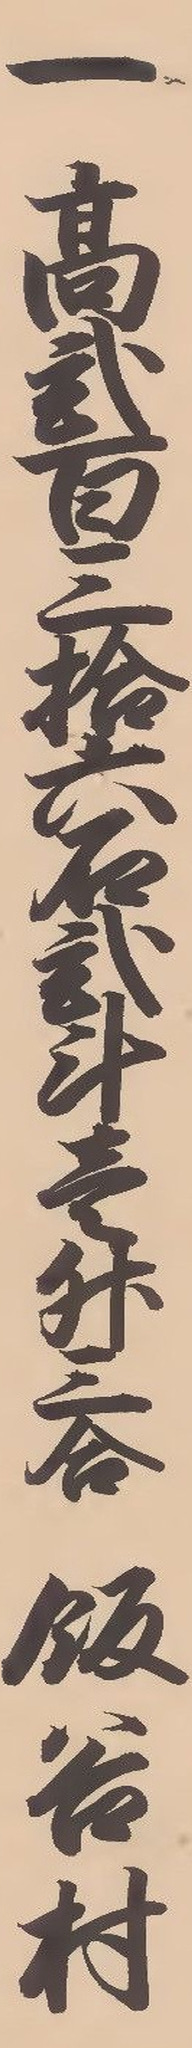一高弐百三拾六石弐斗壱升三合飯谷村
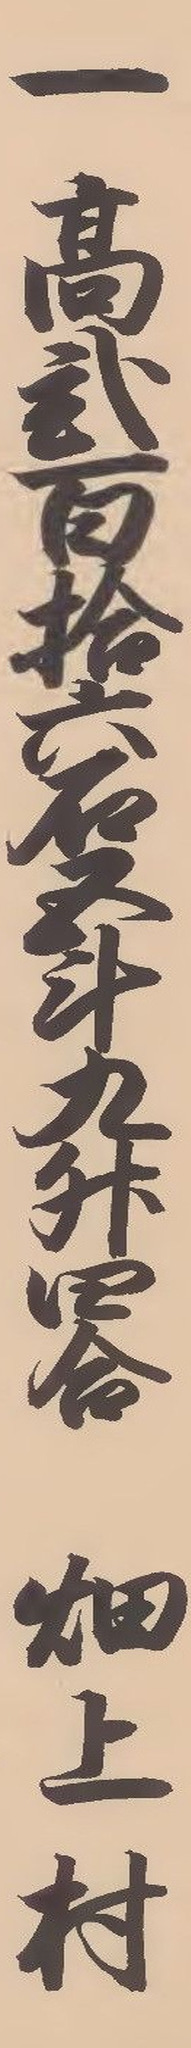一高弐百拾六石五斗九升四合畑上村
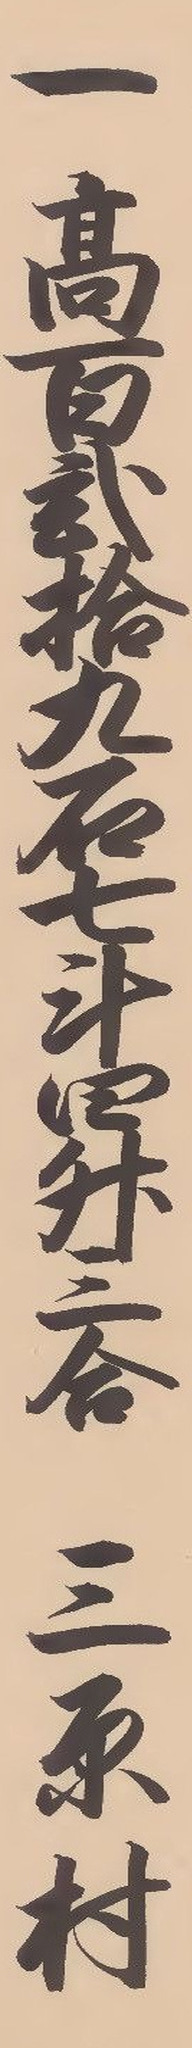一高百弐拾九石七斗四升三合三原村
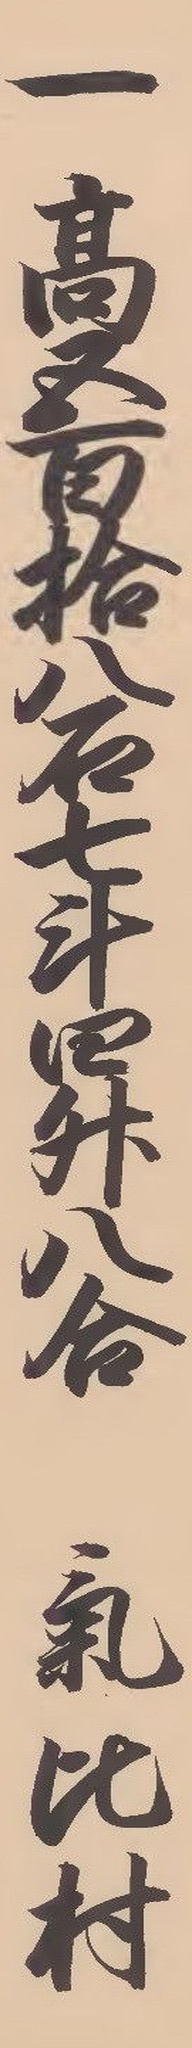一高五百拾八石七斗四升八合気比村

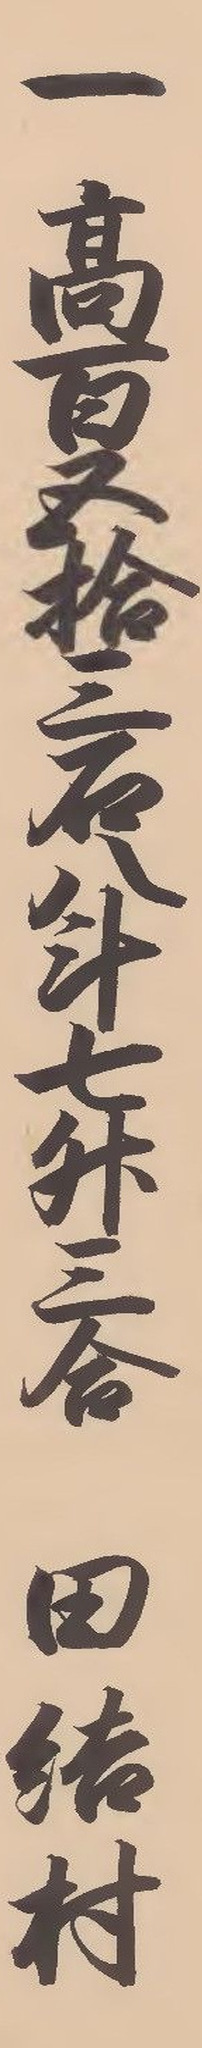一高百五拾三石八斗七升三合田結村
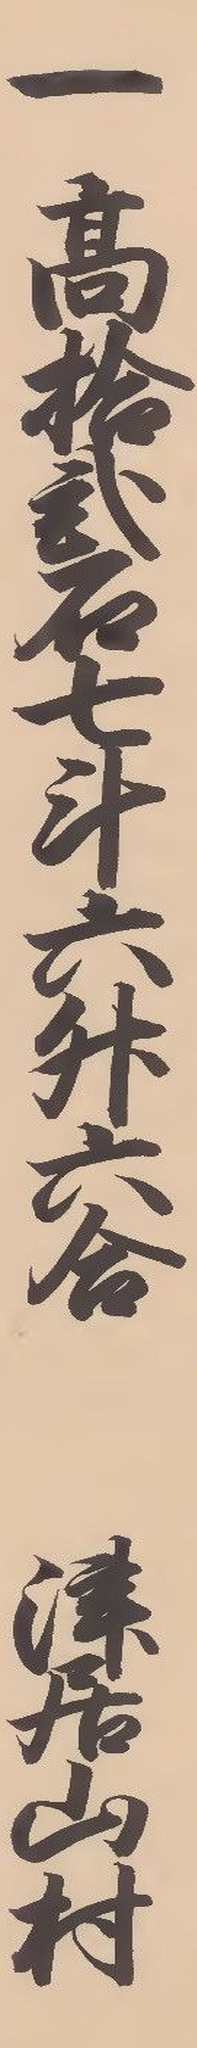一高拾弐石七斗六升六合津居山村
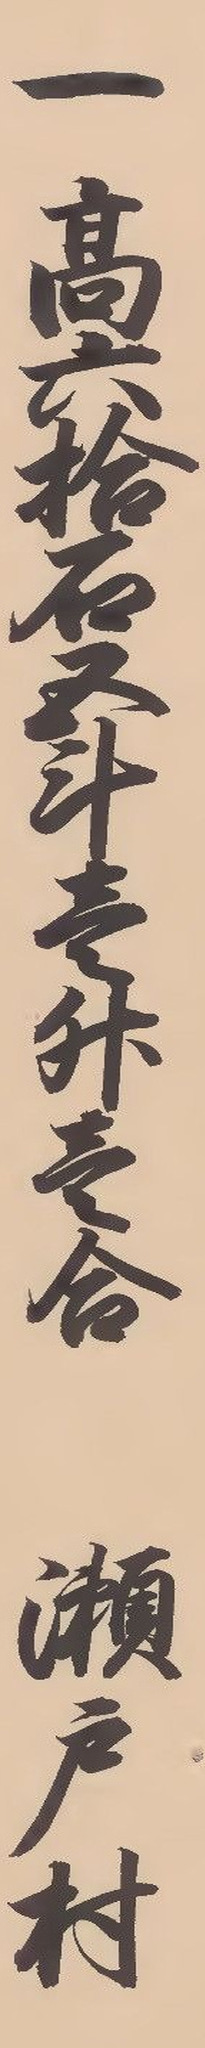一高六拾石五斗壱升壱合瀬戸村
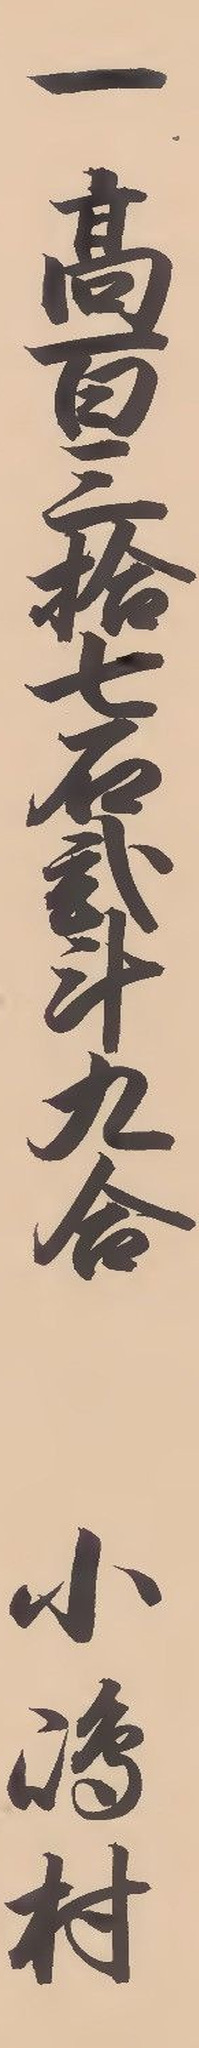一高百三拾七石弐斗九合小嶋村
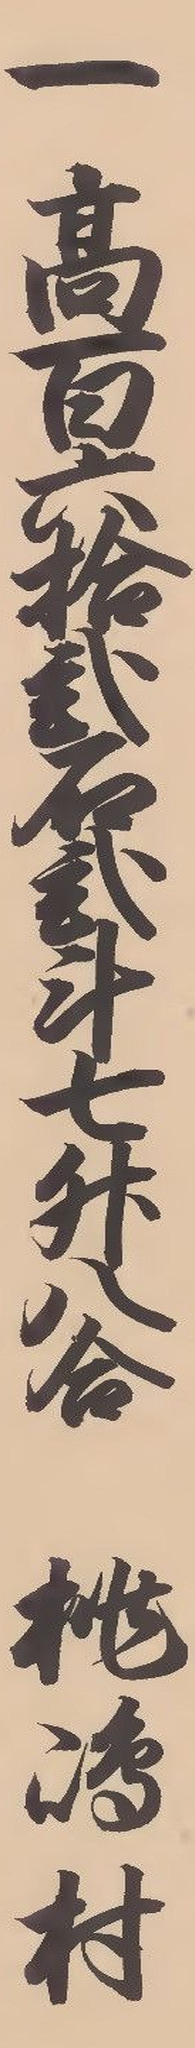一高百六拾弐石弐斗七升八合桃嶋村
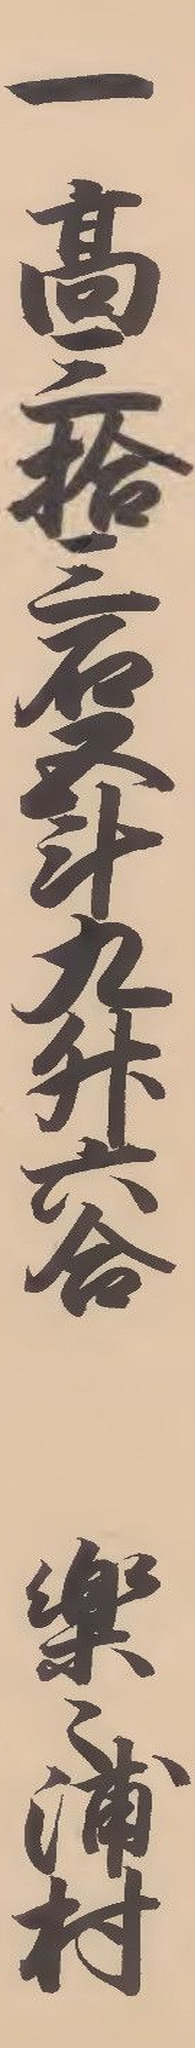一高三拾三石五斗九升六合楽々浦村
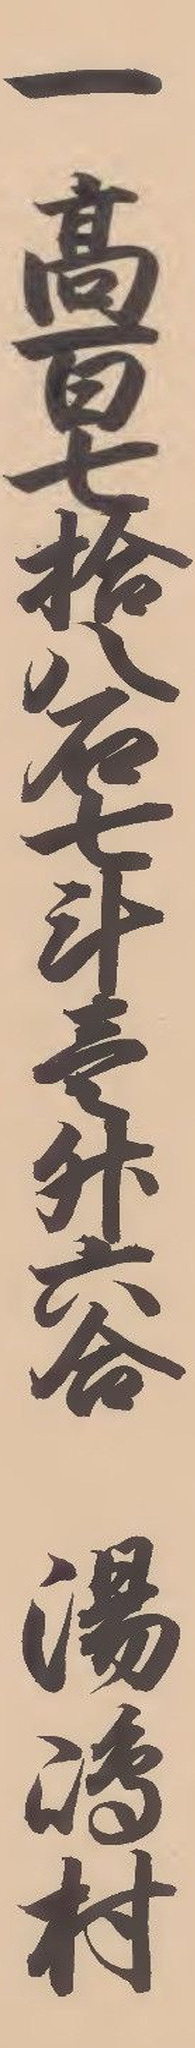一高百七拾八石七斗壱升六合湯嶋村
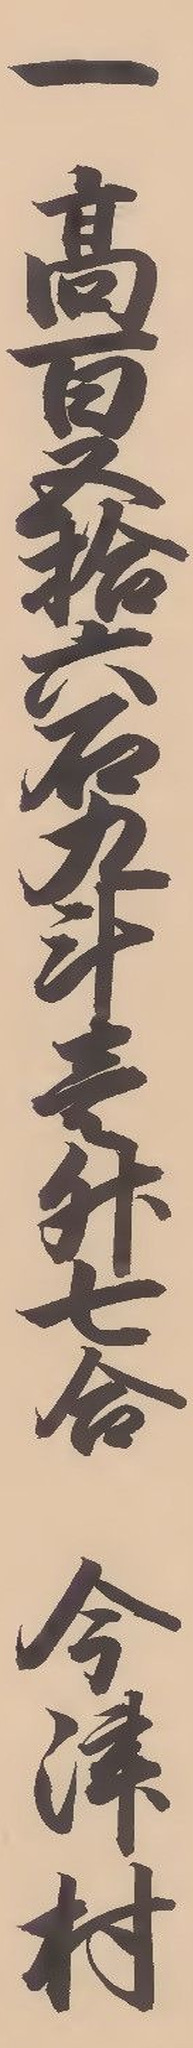一高百五拾六石九斗壱升七合今津村

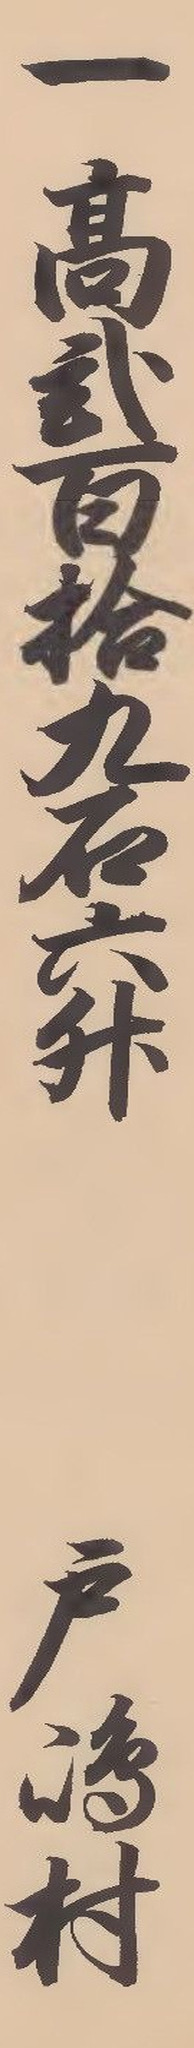一高弐百拾九石六升戸嶋村
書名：但馬国郷帳
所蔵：国立公文書館 National Archives of Japan
